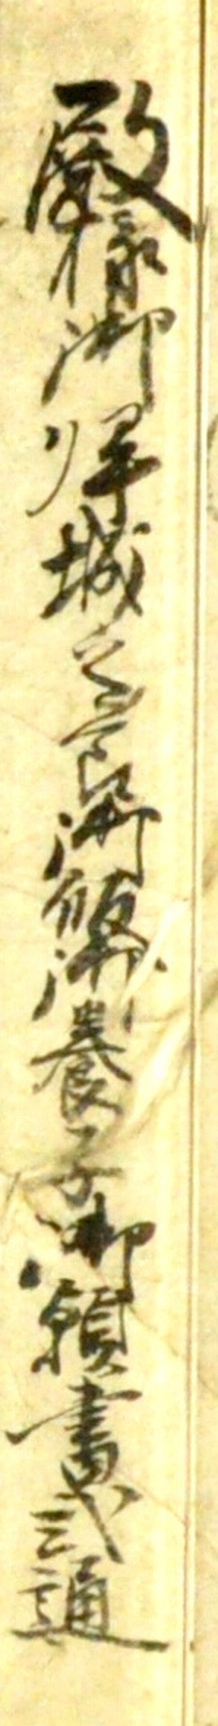殿様御帰城之節御仮御養子御願書弐通

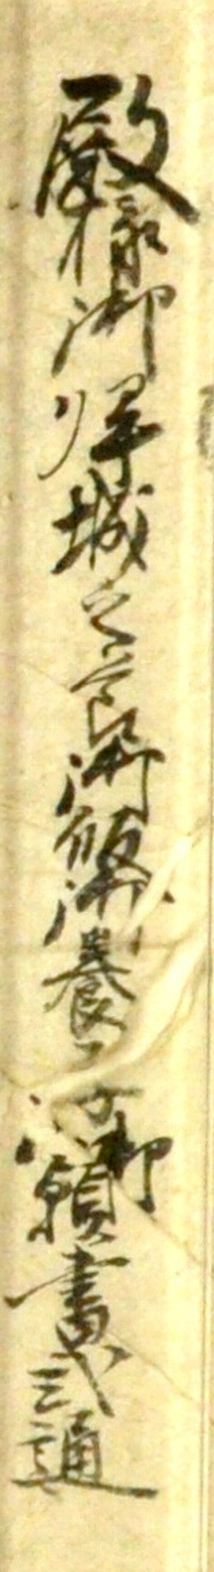殿様御帰城之節御仮御養子御願書弐通
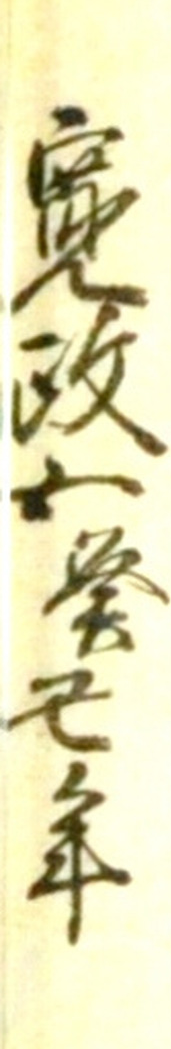寛政五癸丑年
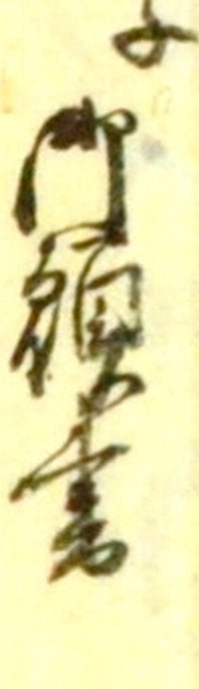御願書

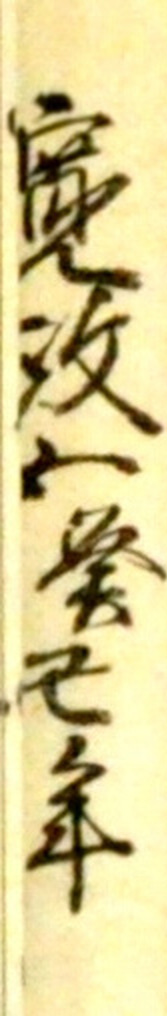寛政五癸丑年
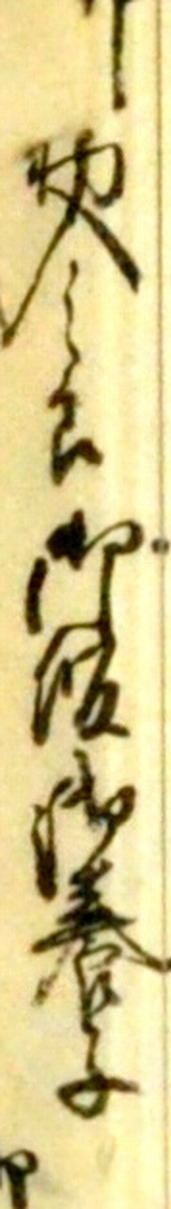御邦入之節御仮御養子
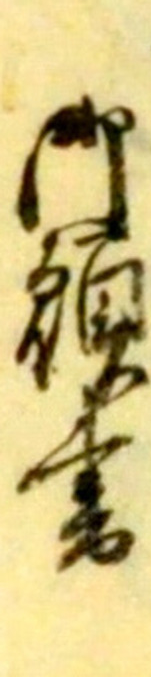御願書

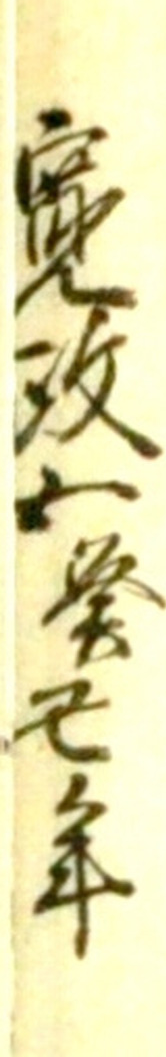寛政五年癸丑年
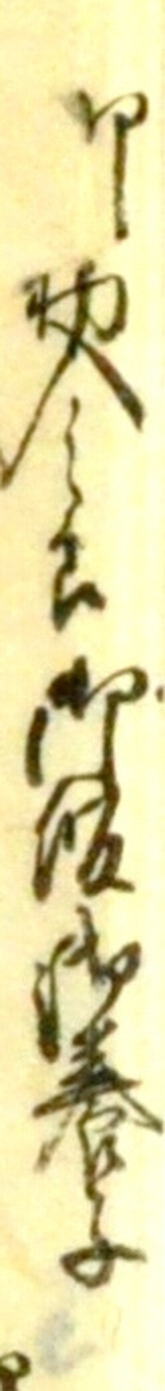御邦入之節御仮御養子
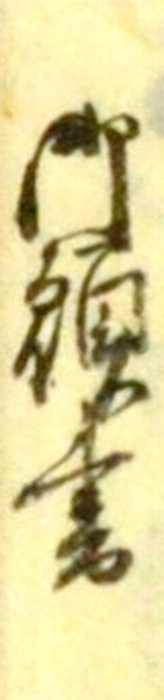御願書
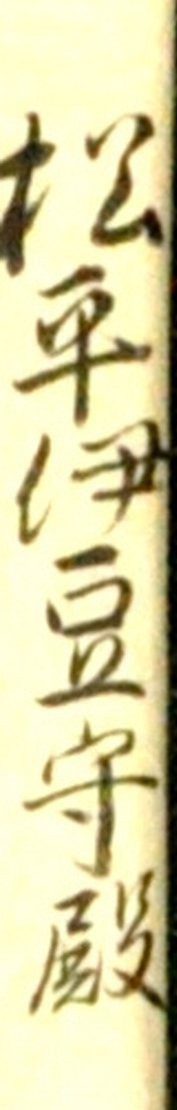松平伊豆守殿
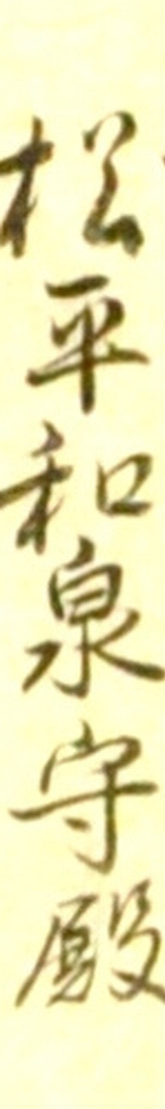松平伊豆守殿
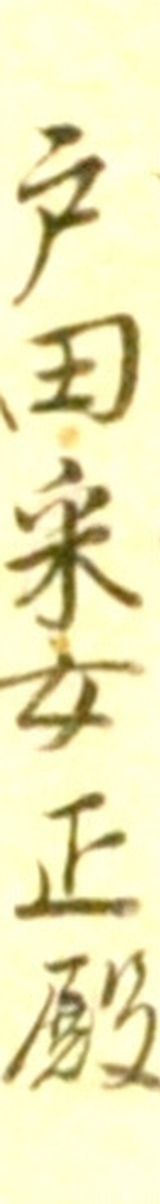戸田采女正殿
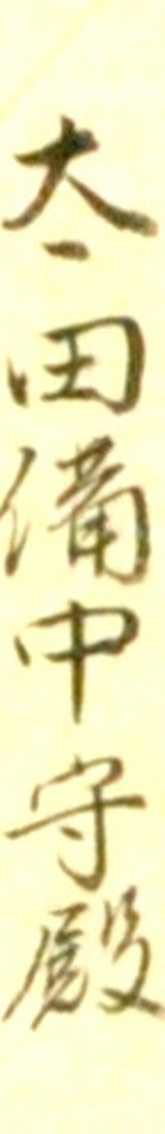太田備中守殿

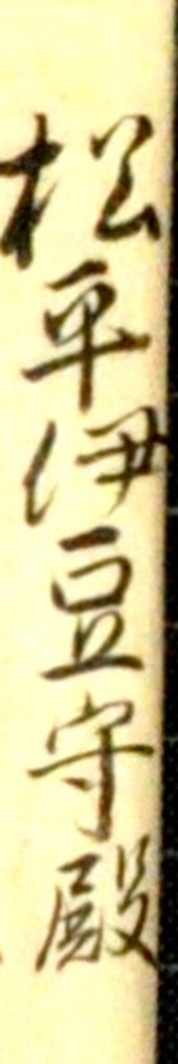松平伊豆守殿
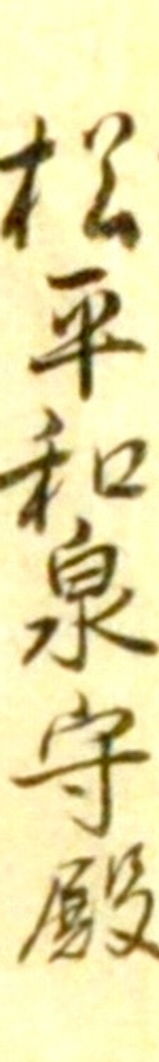松平伊豆守殿
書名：仮養子願
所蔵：伊那市立高遠町図書館・合同会社AMANE
